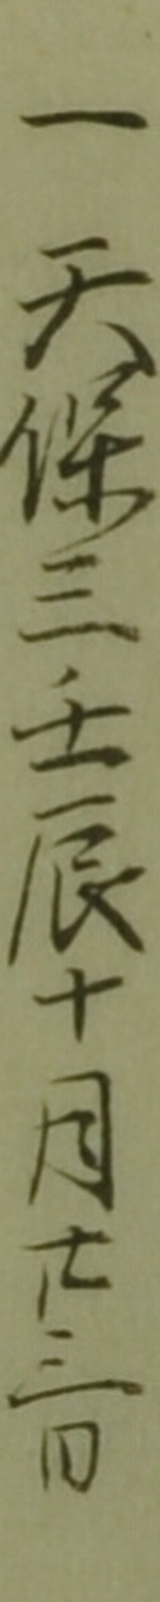一天保三壬辰十月廿三日
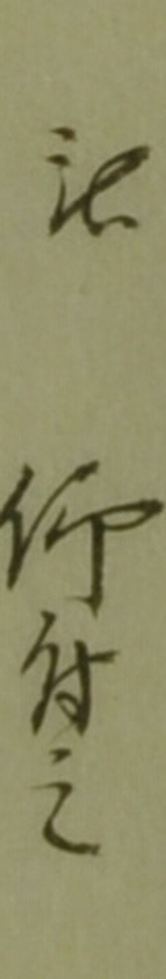被仰付之
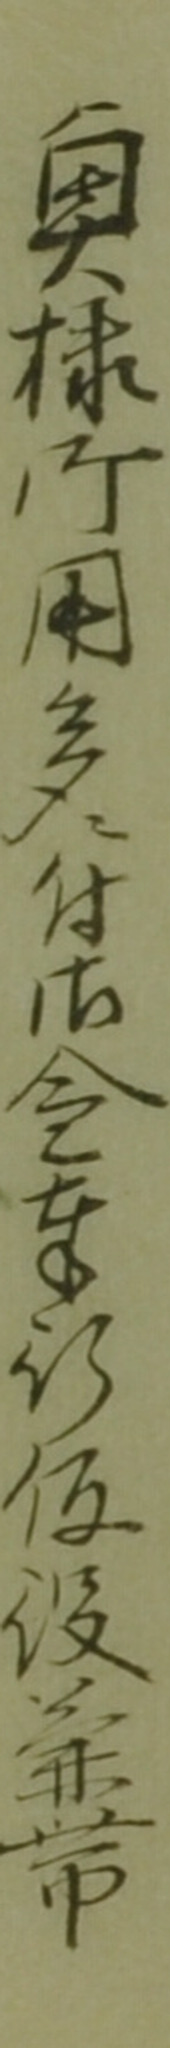奥様御用多付御金奉行仮役兼帯
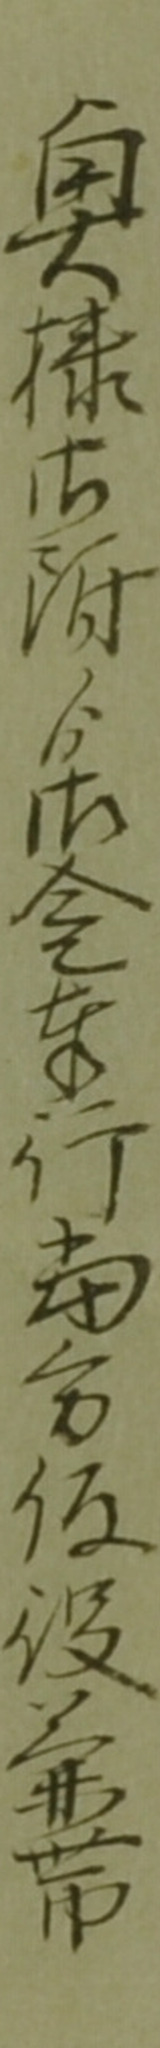奥様御附ゟ御金奉行当分仮役兼帯
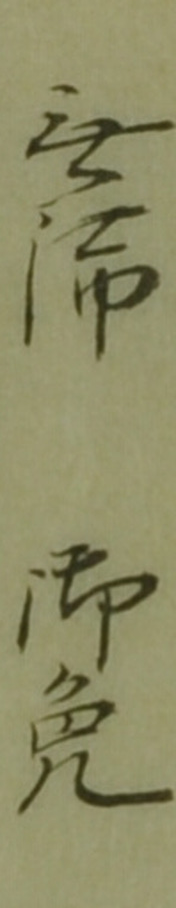無滞御免

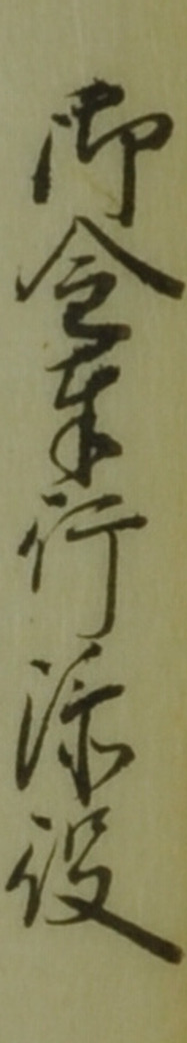御金奉行添役
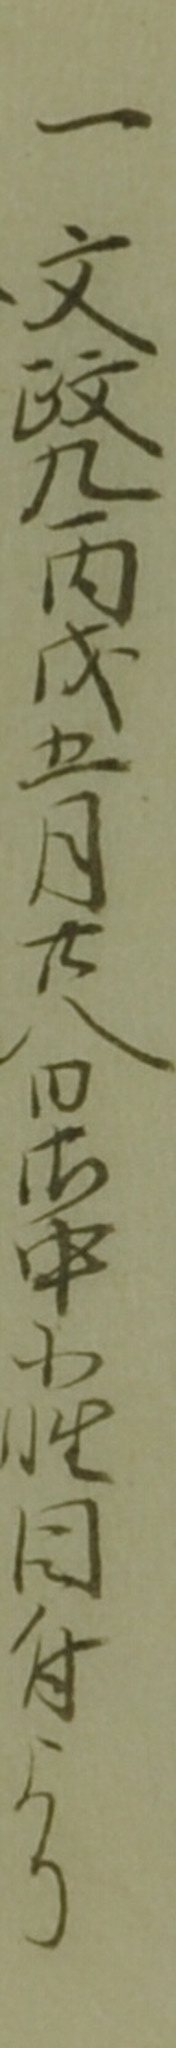一文政九丙戌五月廿八日御中小性目付より
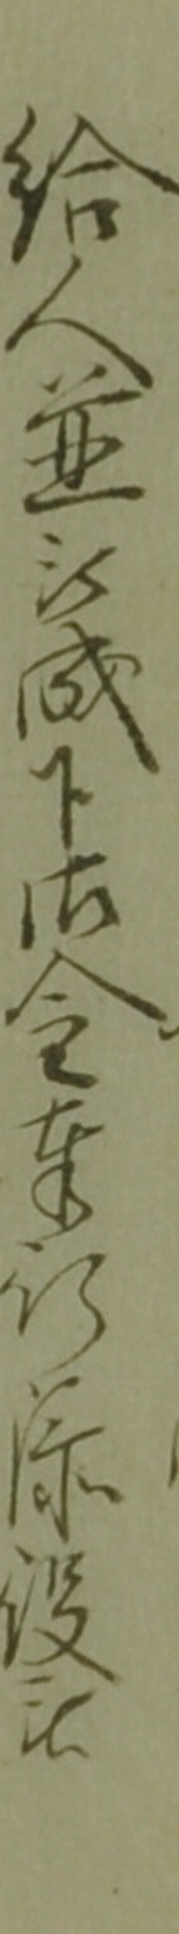給人並被成下御金奉行添役被
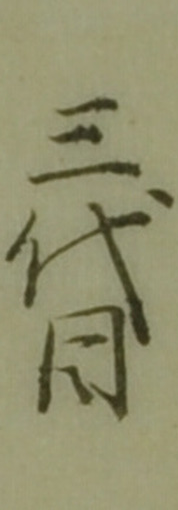三代目
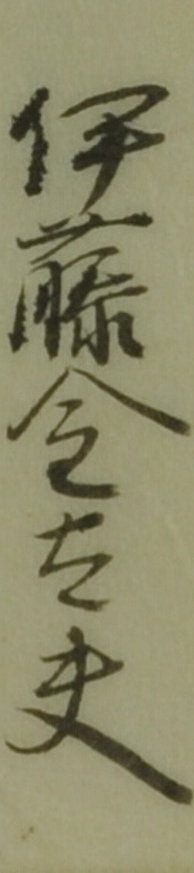伊藤金太夫
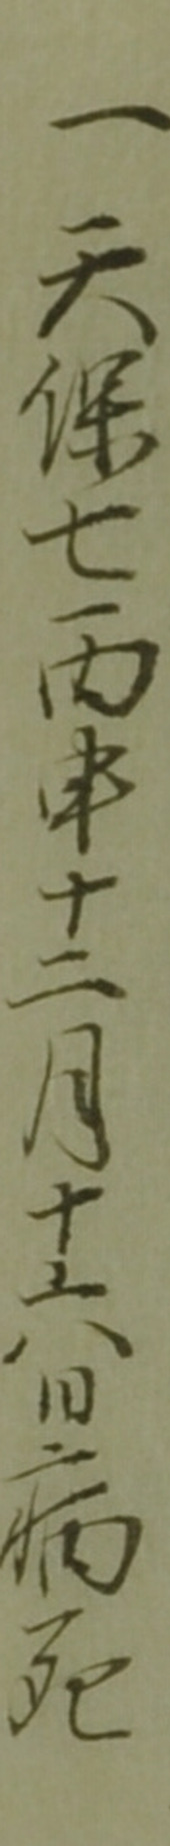一天保七丙申十二月十六日病死
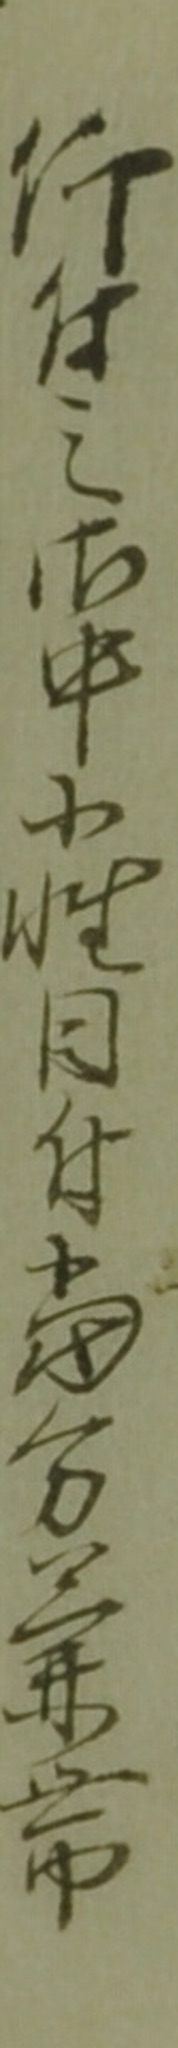仰付之御中小性目付当分兼帯
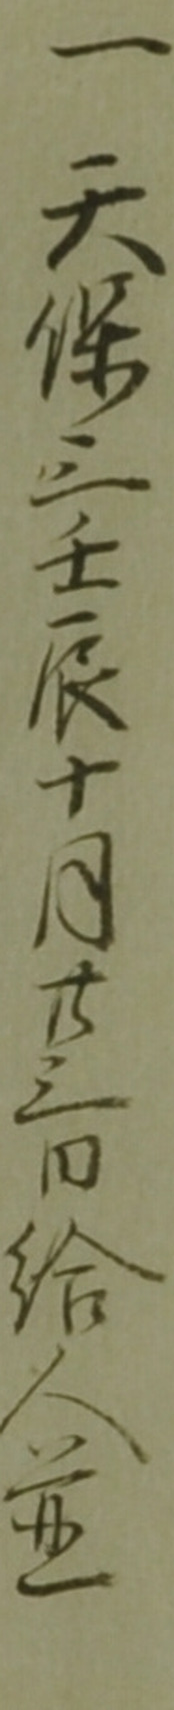一天保三壬辰十月廿三日給人並
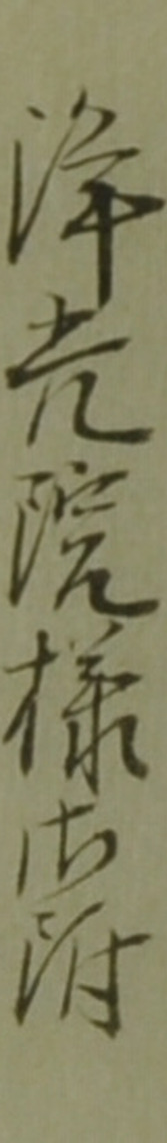浄光院様御附
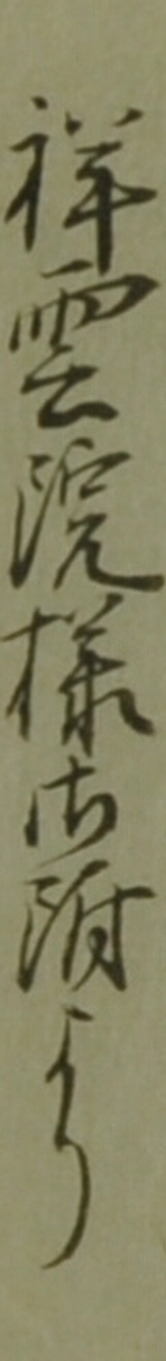祥雲院様御附より
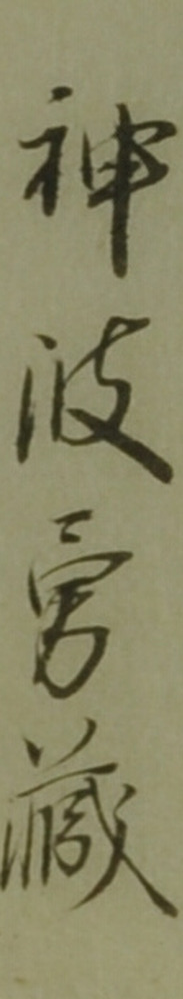神波勇蔵
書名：諸御役代々録（七）
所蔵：伊那市立高遠町図書館・合同会社AMANE
